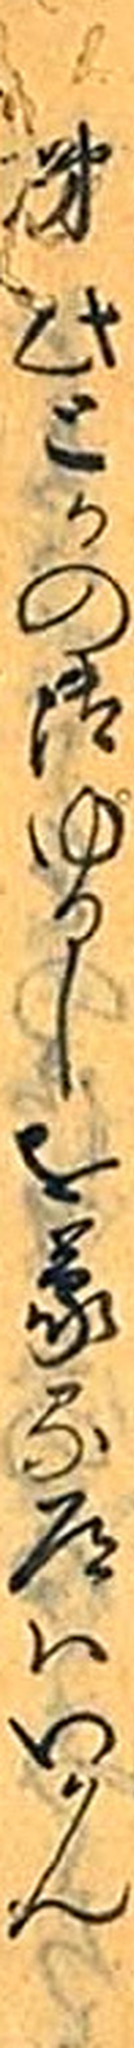弟此とかの御ゆるしを蒙る道はいかん
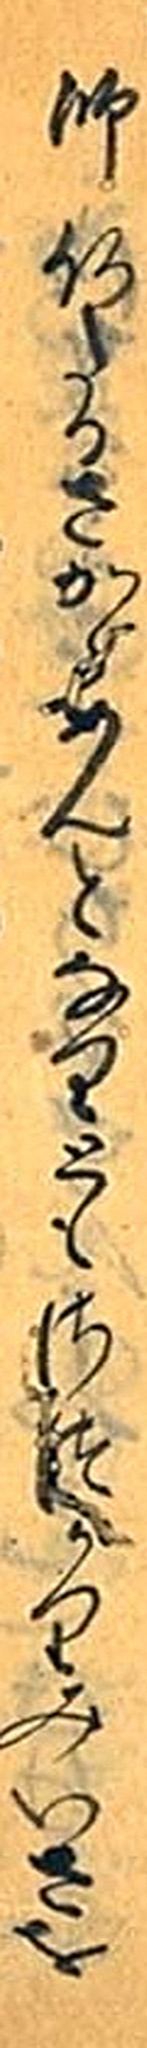師何たるさからめんとなりともさつかりみいさを
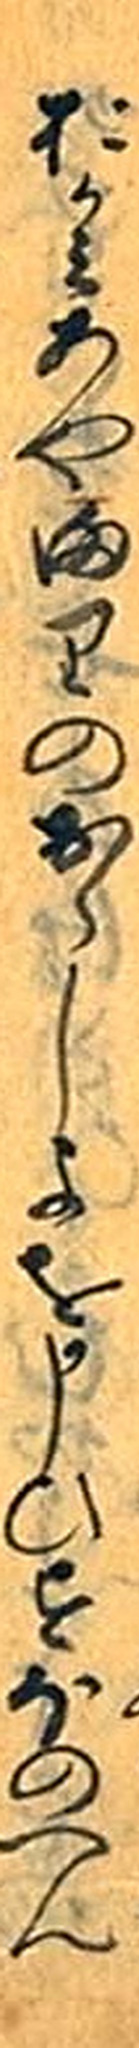おかみあやまりのおらしよを申ひすほのへん
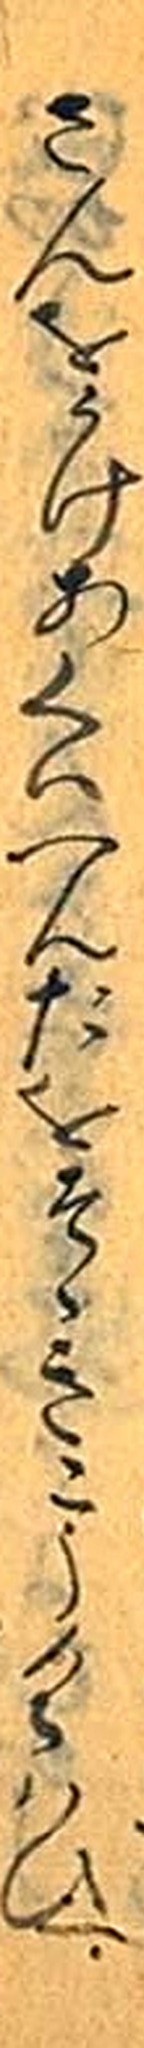さんをうけあくはへんたをそゝきこうくはひ
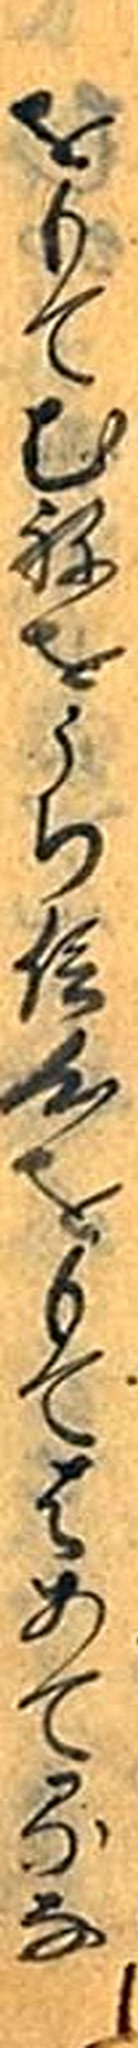をもてむねをうち信心をもてはあてるな
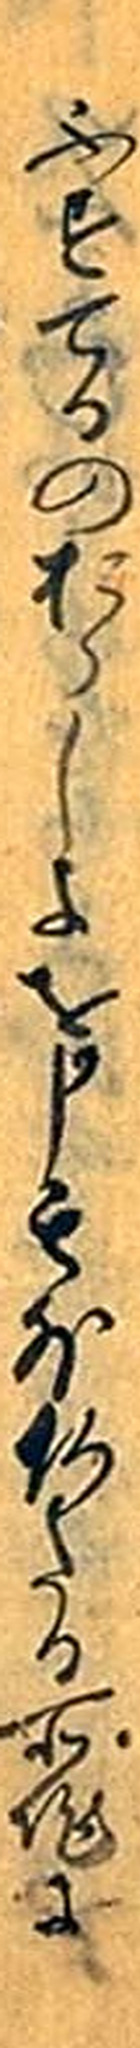ふすてるのおらしよを申其外何たる所作に
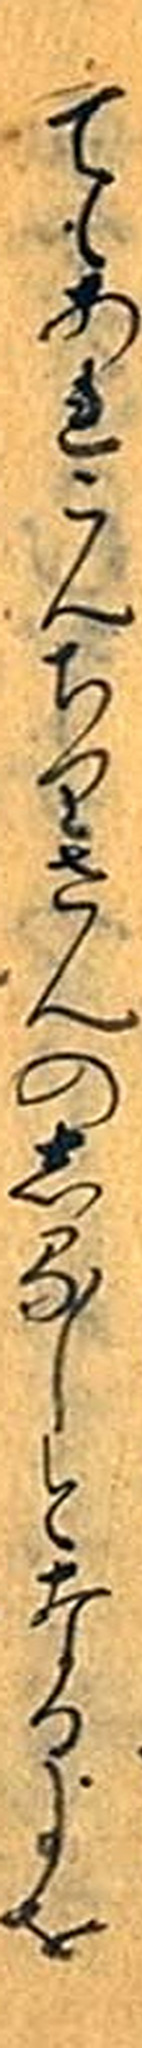てもあれこんちりさんのしるしとなる事を
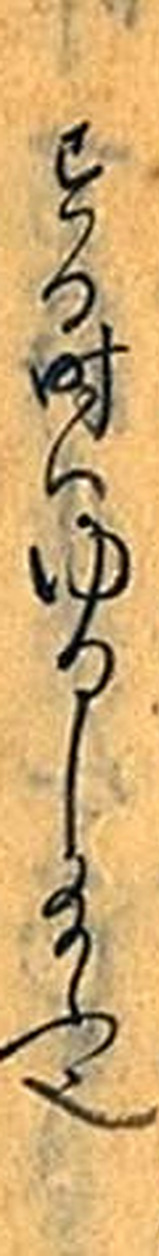する時はゆるし給ふ也
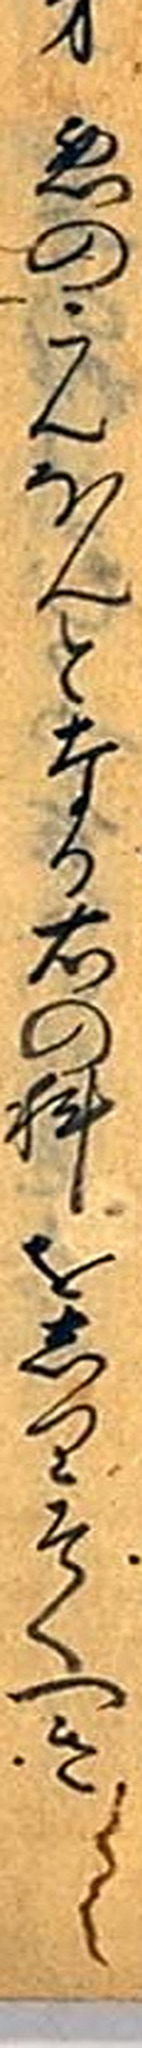弟悪のこんほんとなる右の科をしりそくへき
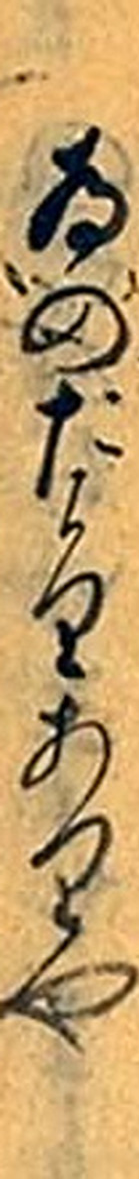為のたよりありや
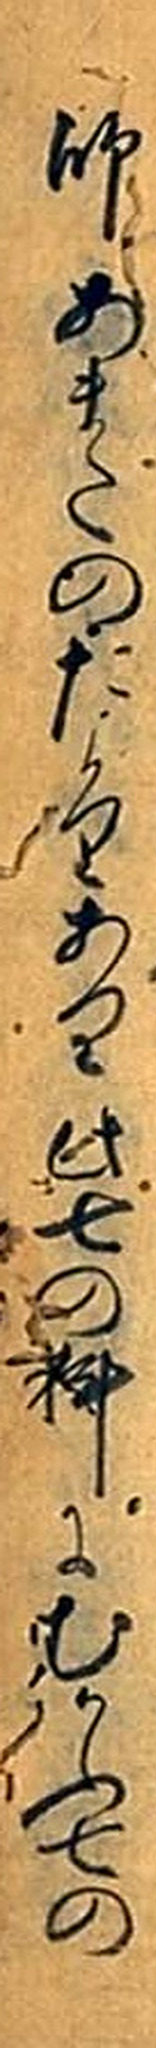師あまたのたよりあり此七の科にむかふ七の

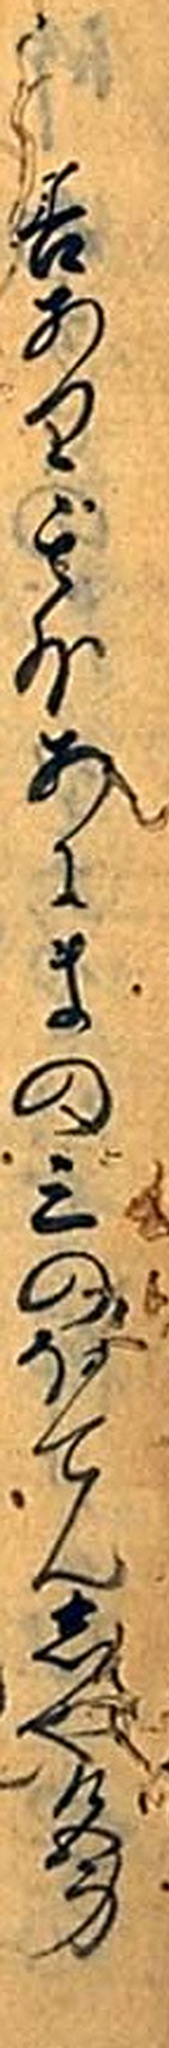善あり其外あにまの三のほてんしや色身
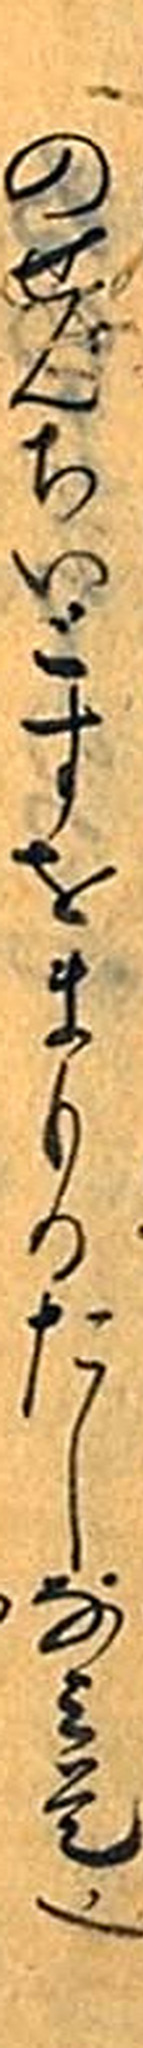のせんちいとすをまもるたしなみ是也
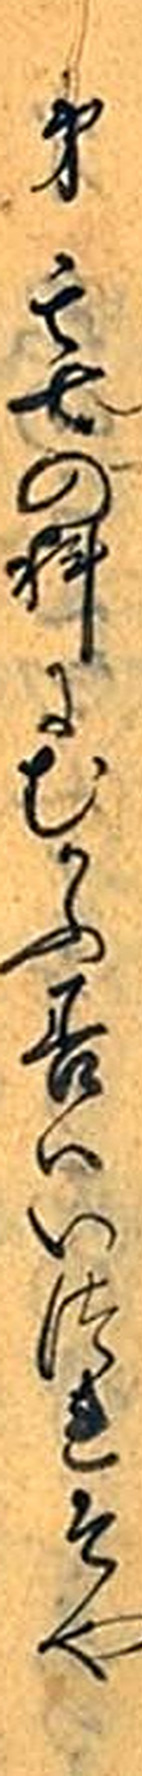弟其七の科にむかふ善はいつれそや
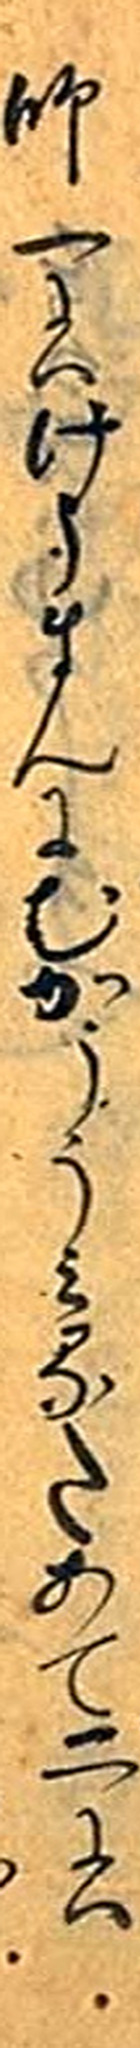師一にはけうまんにむかううみるたあて二には
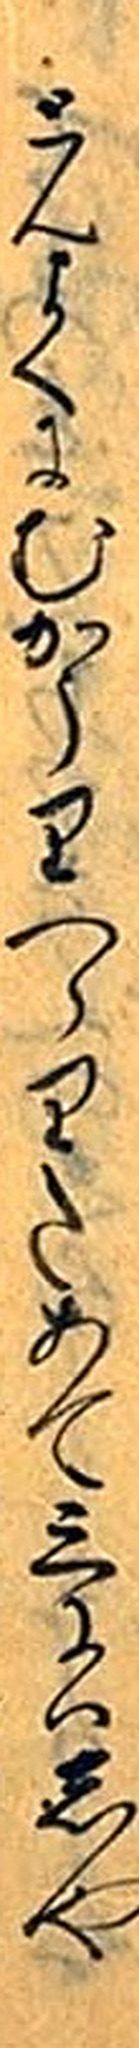とんよくにむかうりへらりたあて三にはしや
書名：ドチリナ・キリシタン
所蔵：東京大学総合図書館 / General Library in the University of Tokyo
